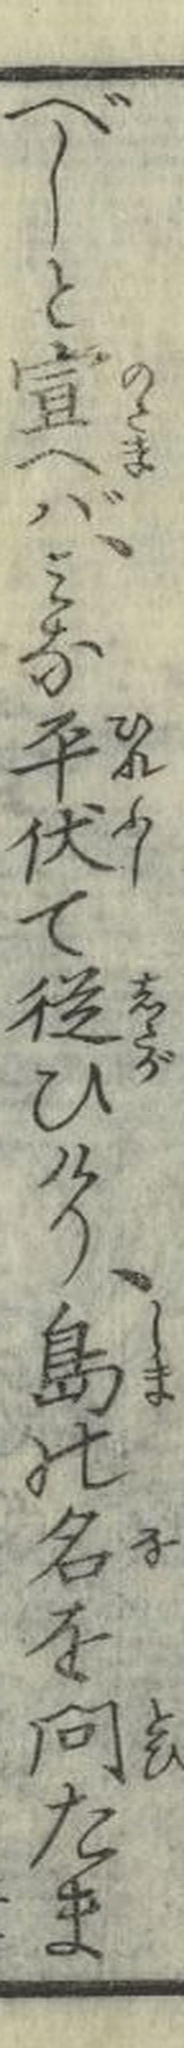べしと宣へば、みな平伏て従ひけり、島の名を問たま
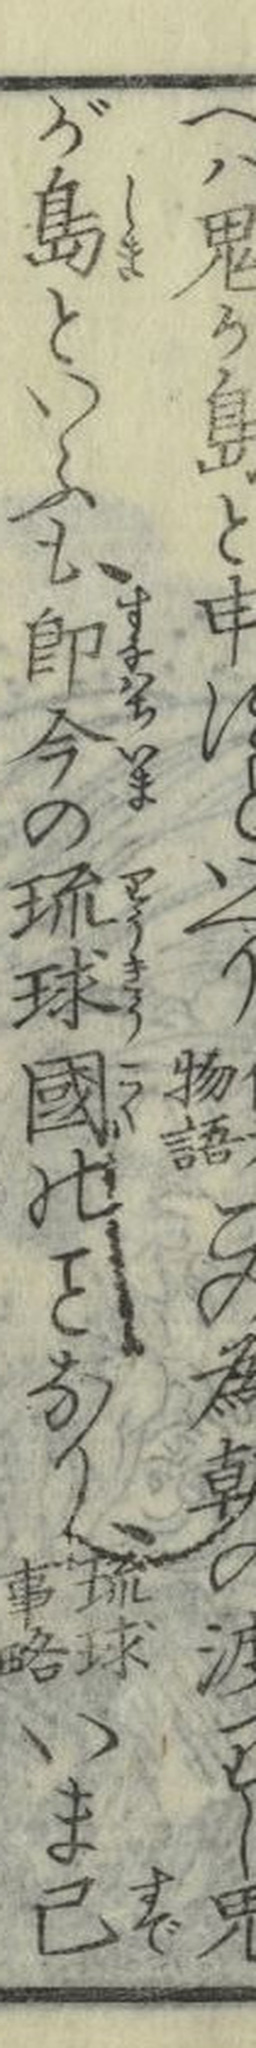が島といふも、即今の琉球国のことなり、琉球事略いま已
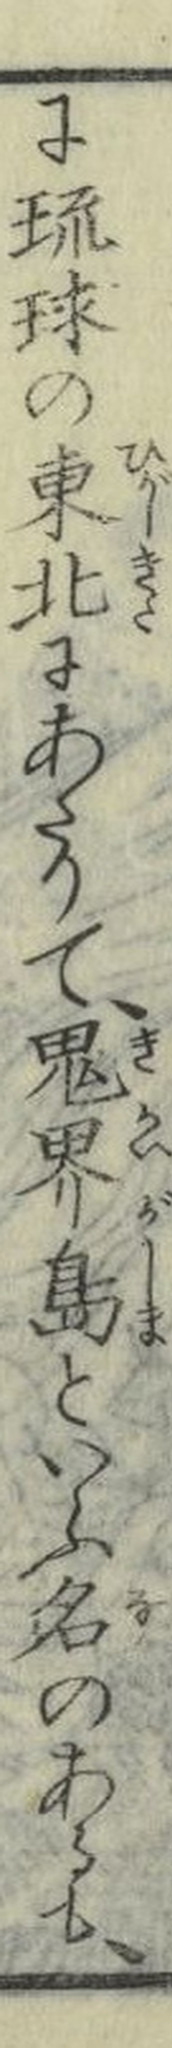に琉球の東北にあたりて、鬼界島といふ名のあるも、
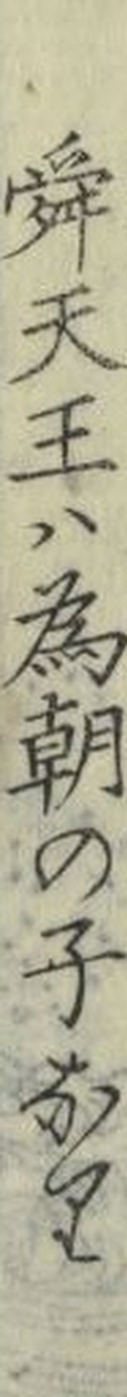舜天王は為朝の子なり
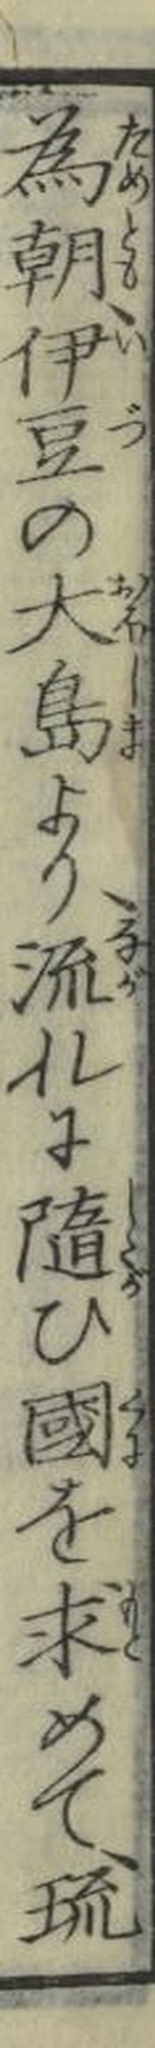為朝、伊豆の大島より、流れに随ひ国を求めて、琉
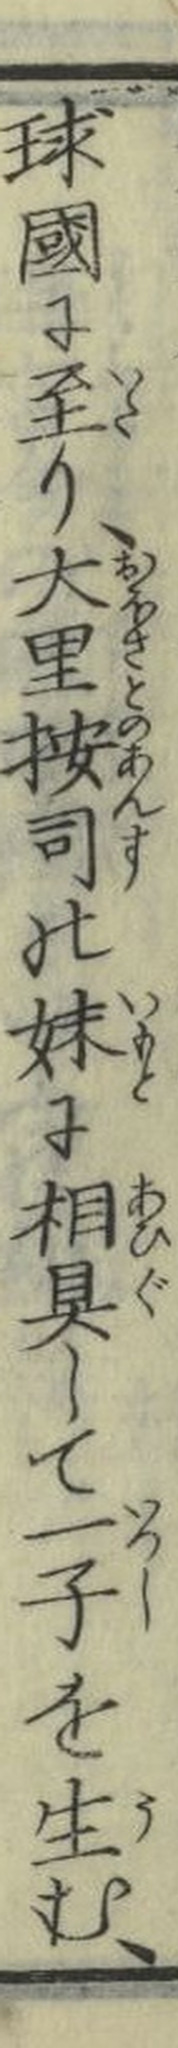球国に至り、大里按司の妹に相具して一子を生む、
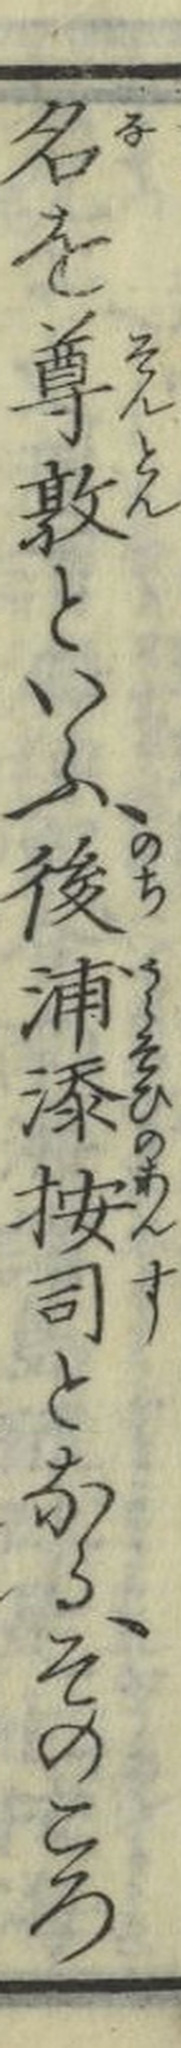名を尊敦といふ、後浦添按司となる、そのころ
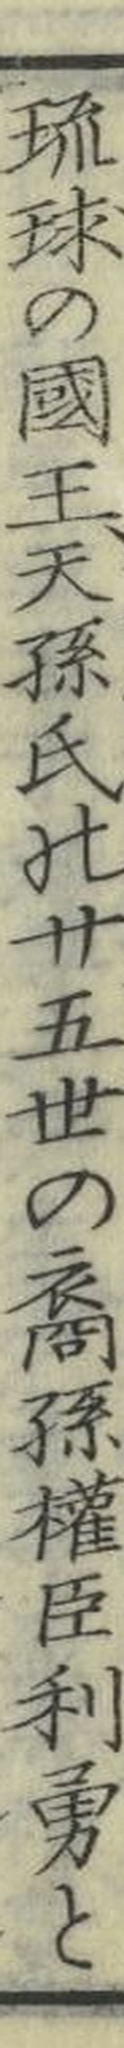琉球の国王、天孫氏の廿五世の裔孫、権臣利勇と
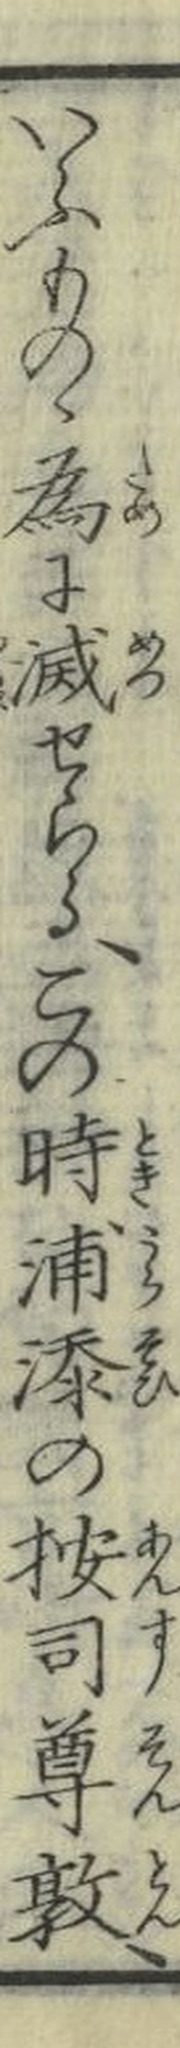いふものゝ為に滅せらる、この時浦添の按司尊敦、
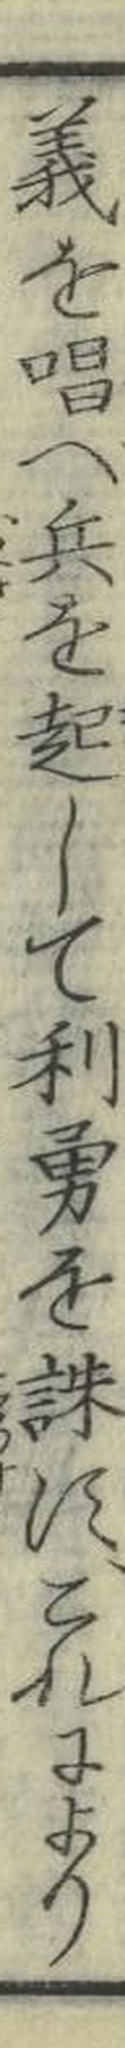義を唱へ兵を起して利勇を誅す、これにより
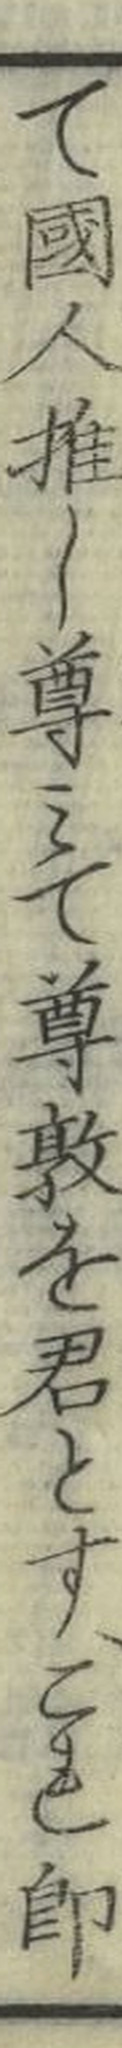て国人推し尊みて尊敦を君とす、これ即
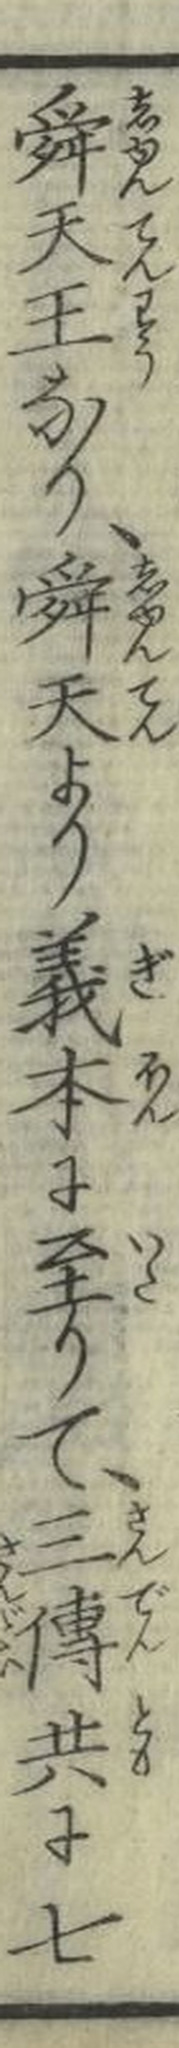舜天王なり、舜天より義本に至りて、三伝共に七
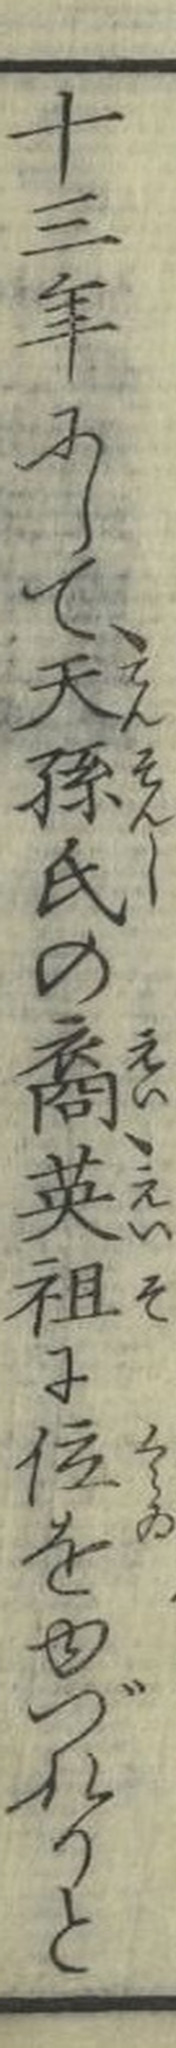十三年にして、天孫氏の裔、英祖に位をゆづれりと

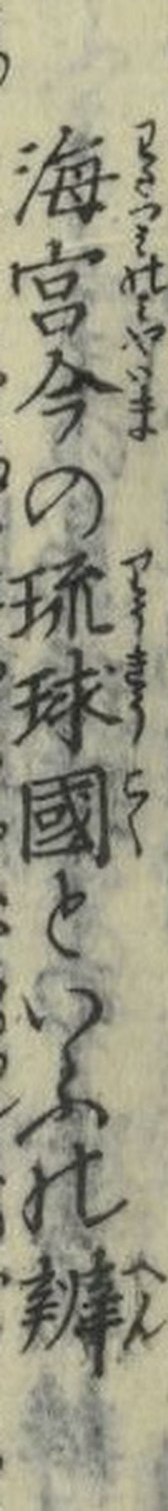海宮今の琉球国といふの弁
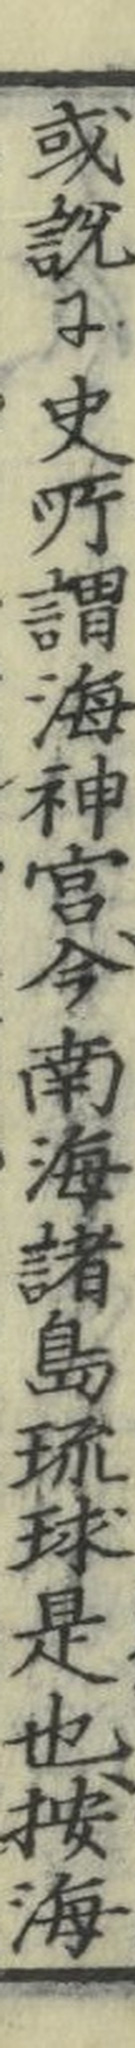或説に、史所謂海神宮、今南海諸島琉球是也、按海
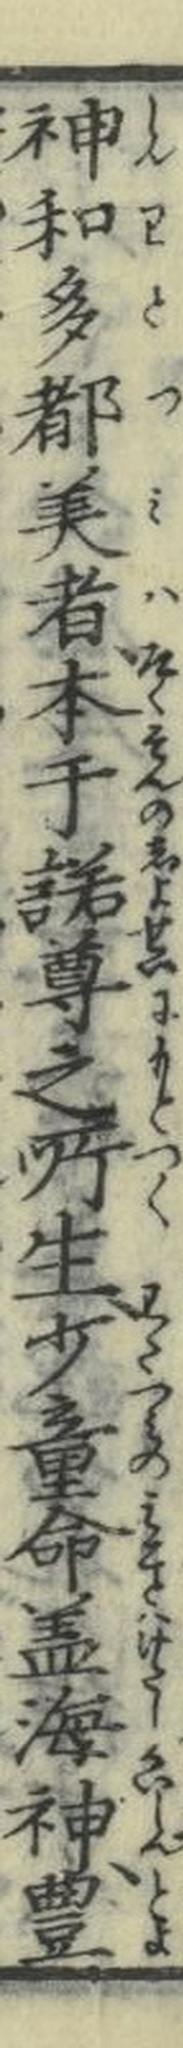神和多都美者、本于諾尊之所生、少童命蓋海神、豊
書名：琉球入貢紀畧
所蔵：University of the Ryukyus Library
